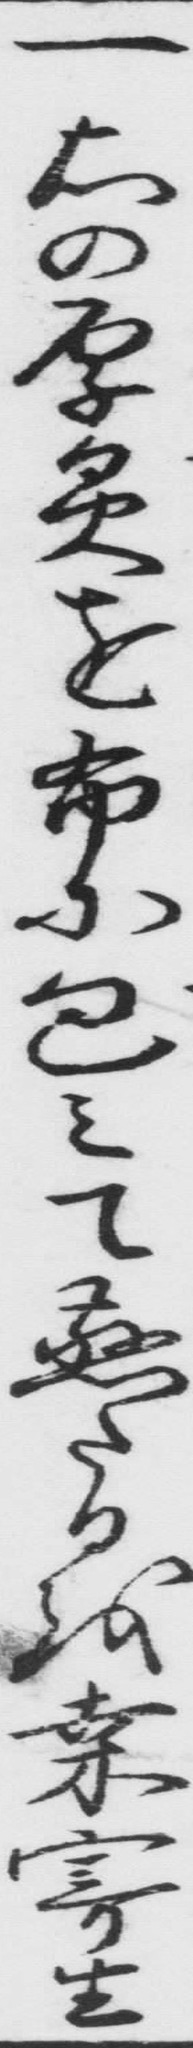一右の厚炙を布に包みて蒸たるを幸寄生

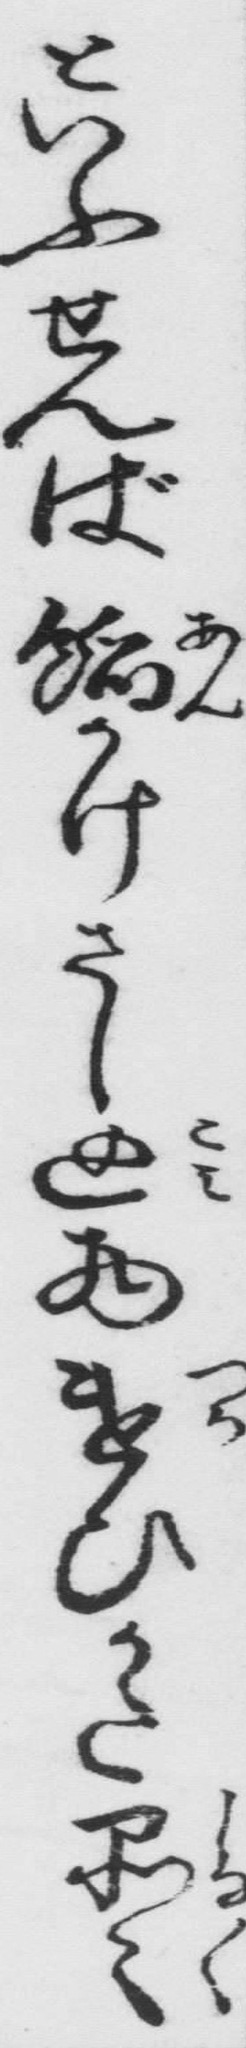といふせんば餡かけさし込物遣ひかた品々
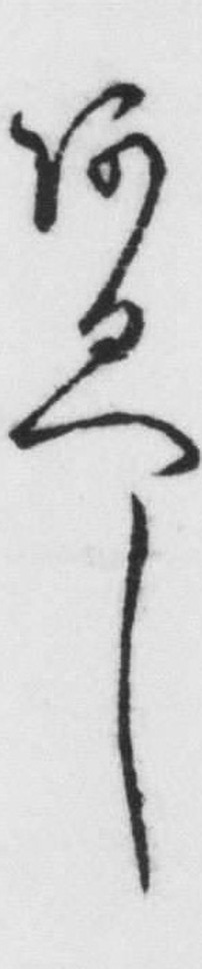あるへし
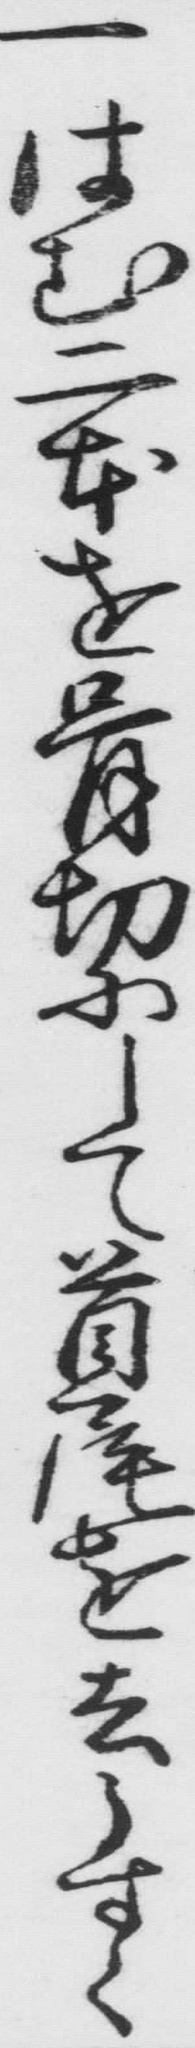一はむ二本を骨切にして首尾を去うすく
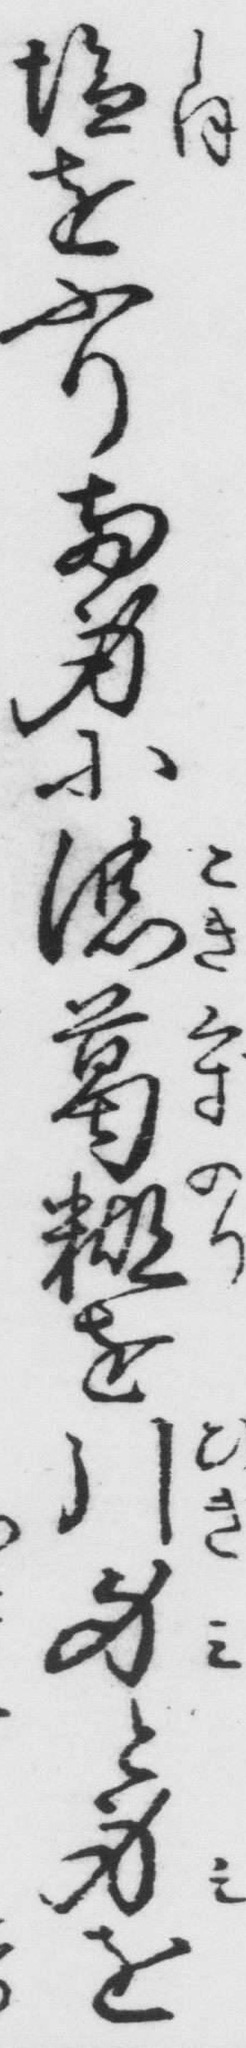塩をふり両身に濃葛糊を引身と身を
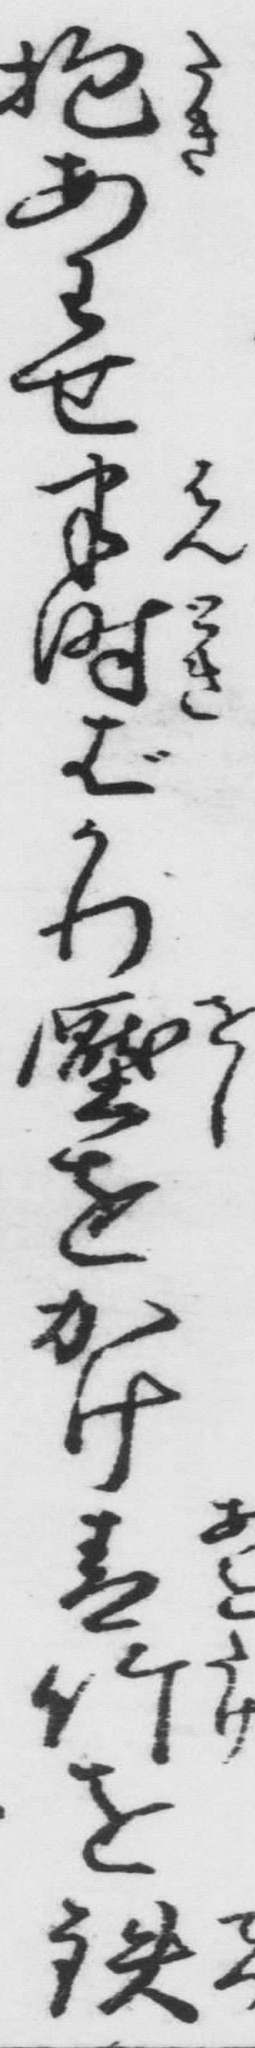抱あわせ半時ばかり壓をかけ青竹を鉄
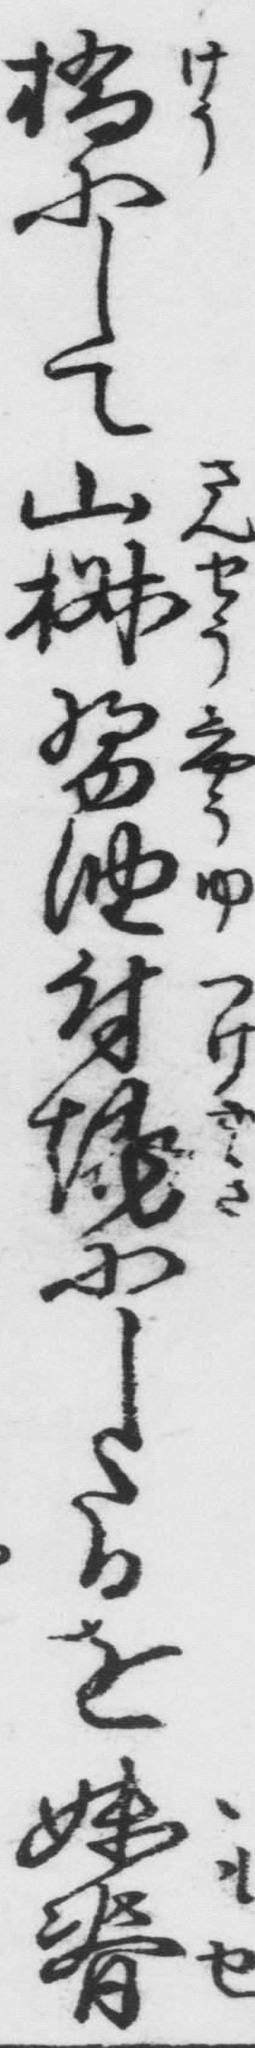橋にして山椒醤油付燒にしたるを妹背
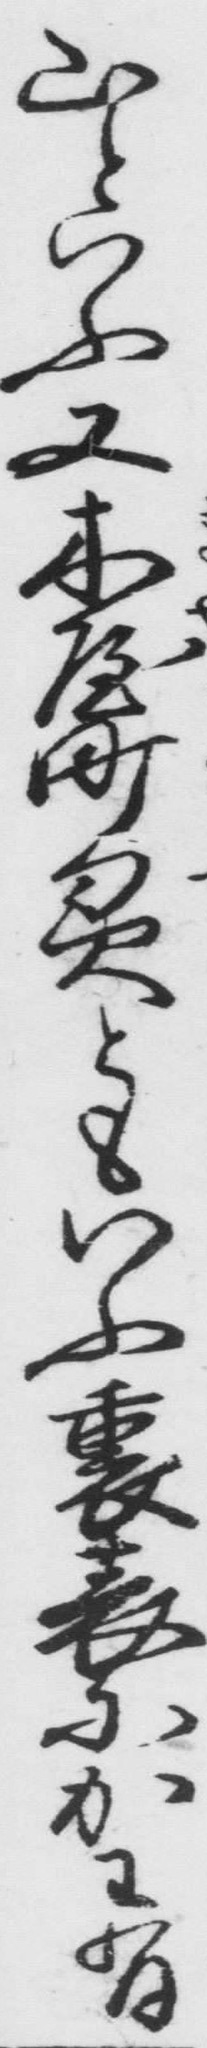山といふ又木屋町炙ともいふ裏表にかわ有
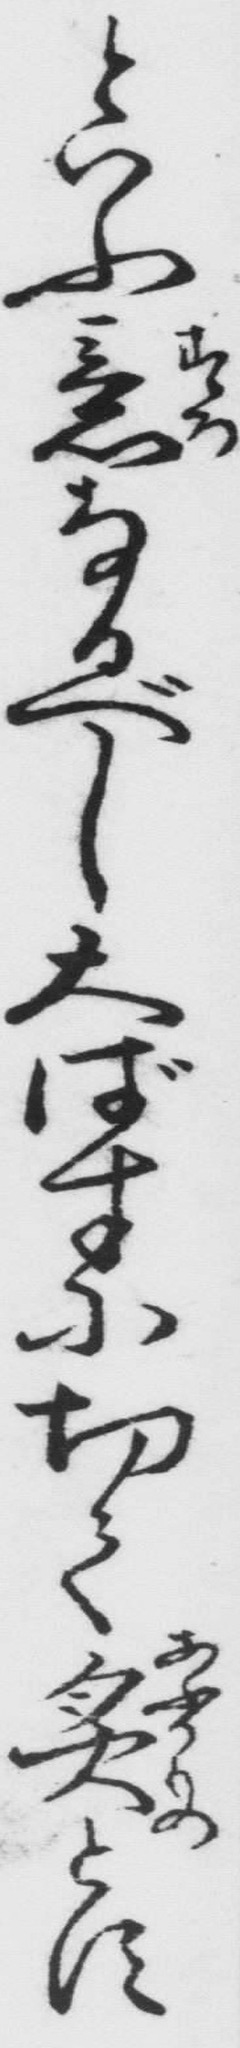といふ意なるべし大ばすに切て炙とす
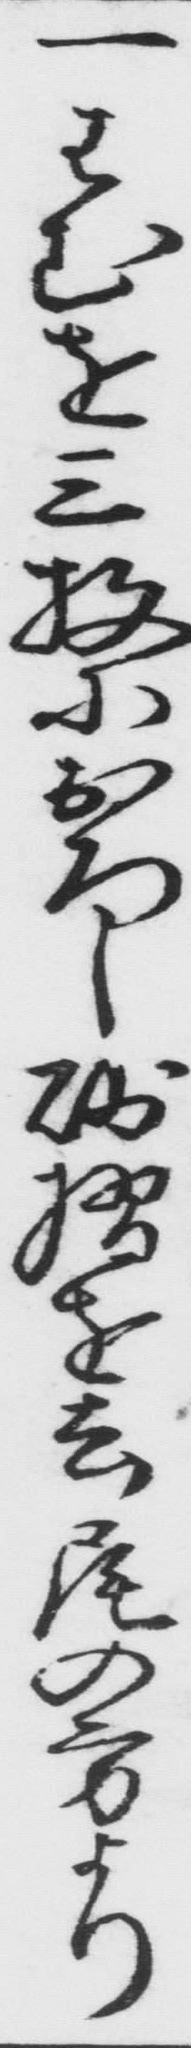一はむを三枚におろし砂摺を去尾の方より
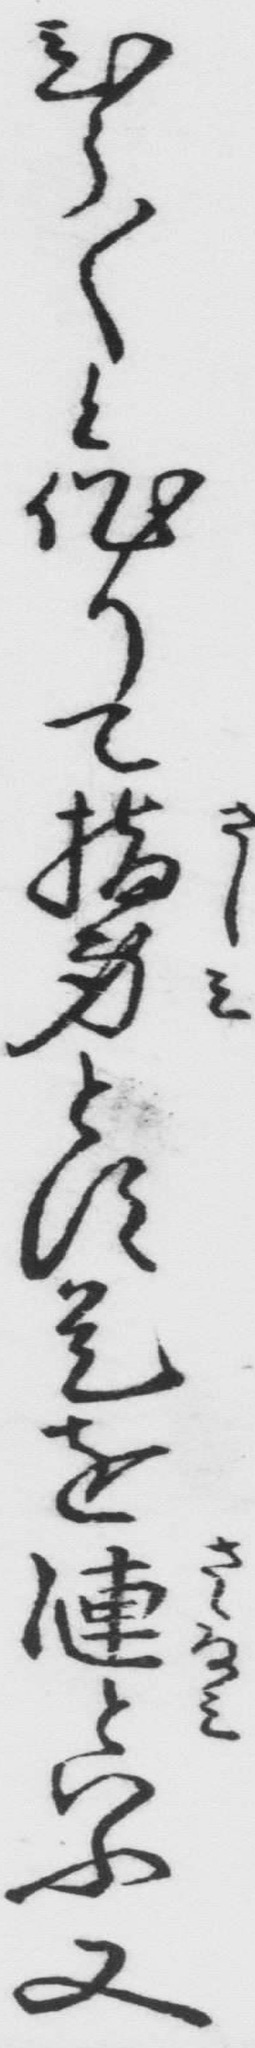ひら〳〵と作りて指身とす是を漣といふ又
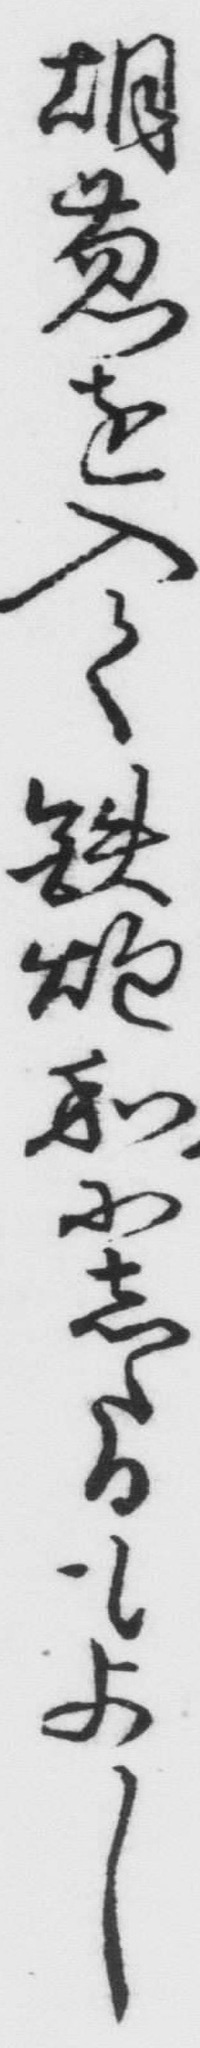胡葱を入て鉄砲和にしたるもよし
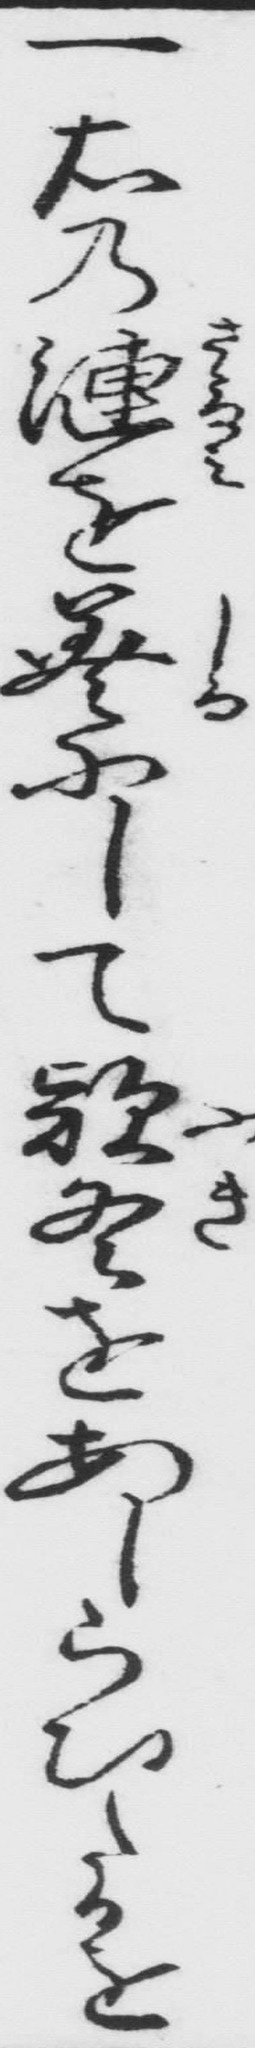一右の漣を羹にして款冬をあしらひたるを
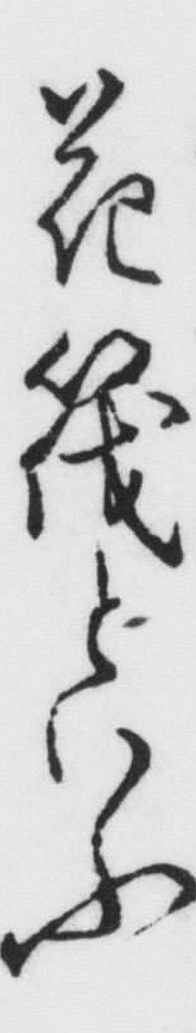花筏といふ
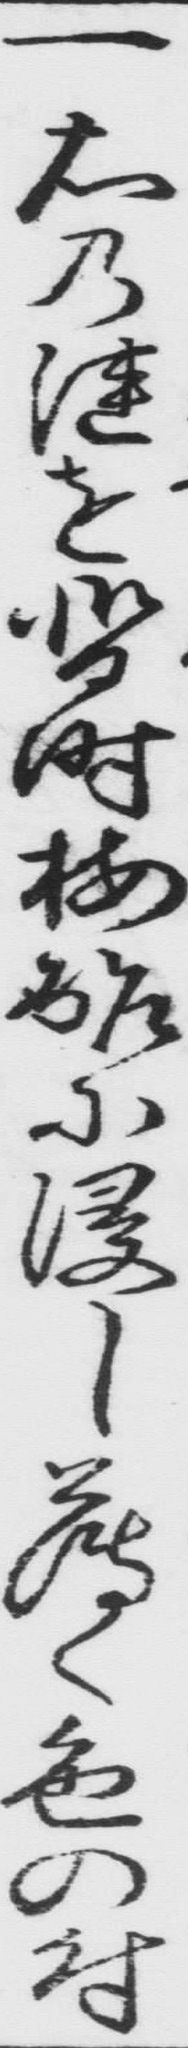一右の漣を暫時梅酢に浸し薄く色の付

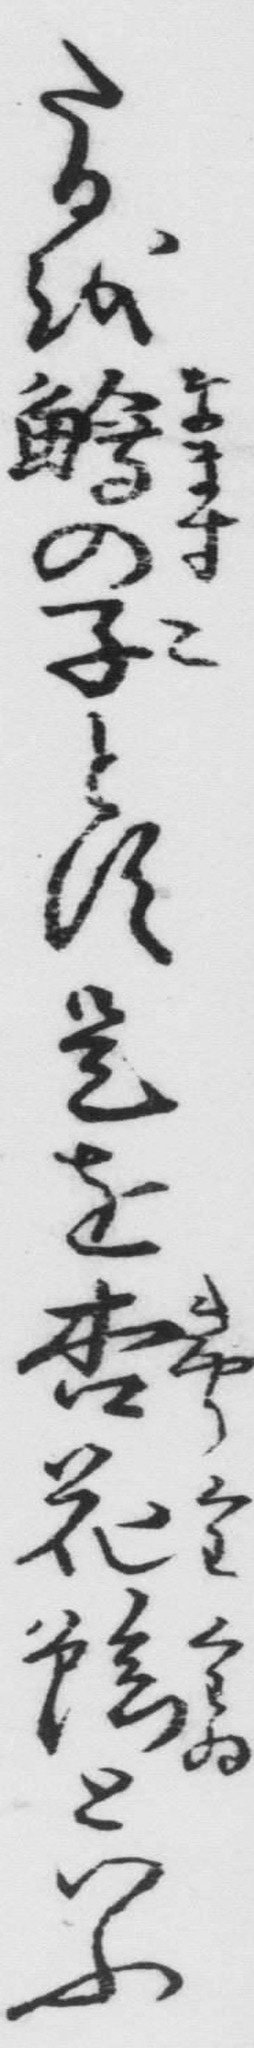たるを鱠の子とす是を杏花鱠といふ
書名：海鰻百珍
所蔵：大阪府立大学学術情報センター 国文学研究資料館
